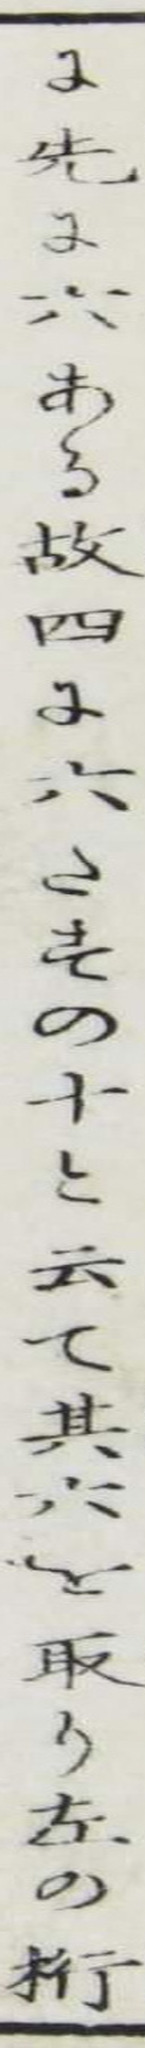に先に六ある故四に六たす十と云て其六を取り左の桁
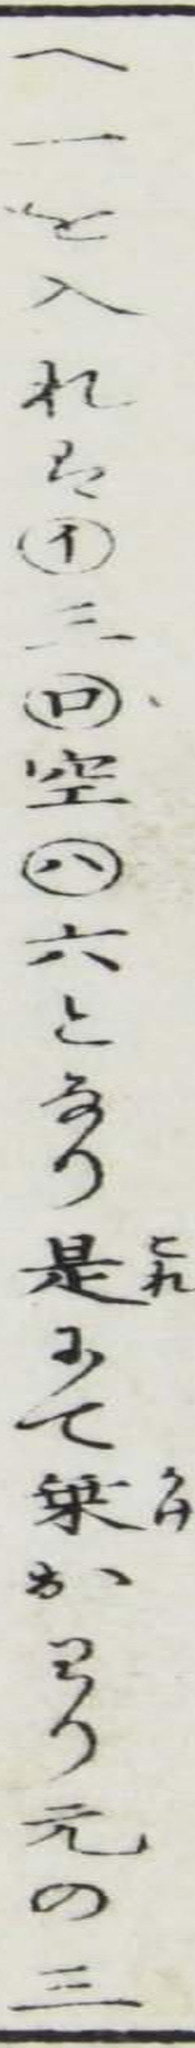へ一を入れは㋑三㋺空㋩六となり是にて乗おわり元の三
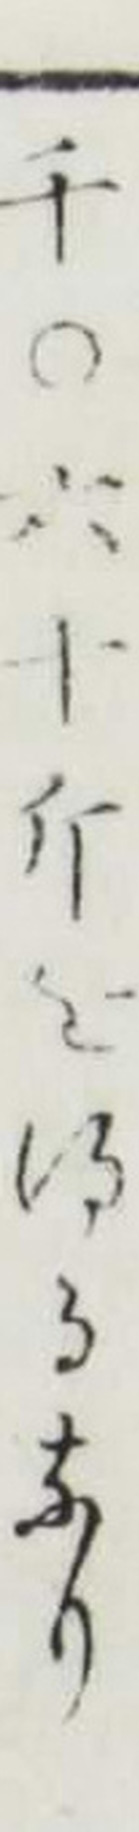千〇六十斤を得るなり
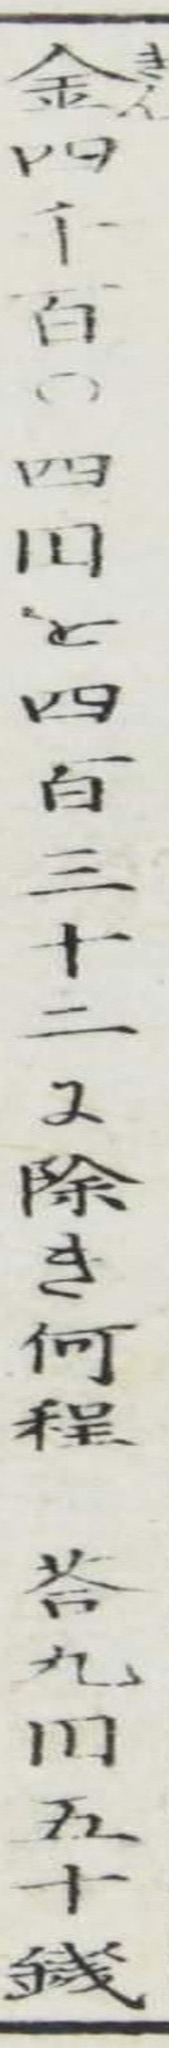金四千百〇四円を四百三十二に除き何程答九円五十銭
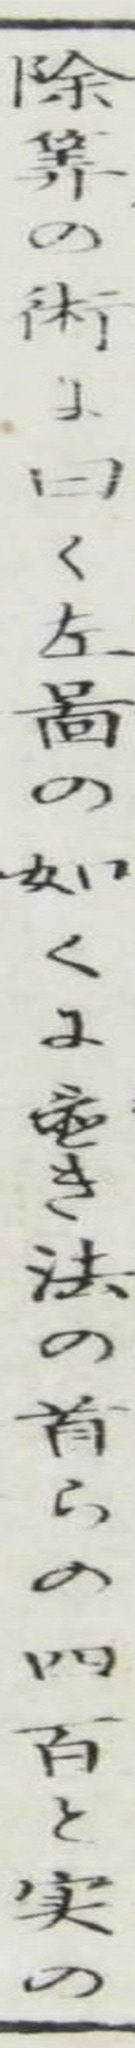除算の術に曰く左図の如くに置き法の首らの四百と実の
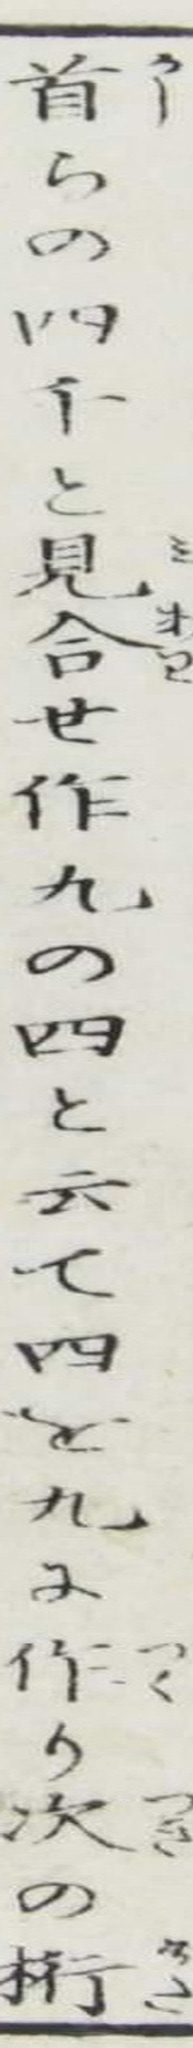首らの四千と見合せ作九の四と云て四を九に作り次の桁
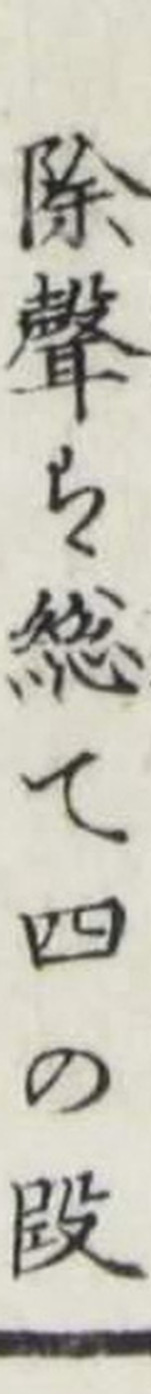除声は総て四の段
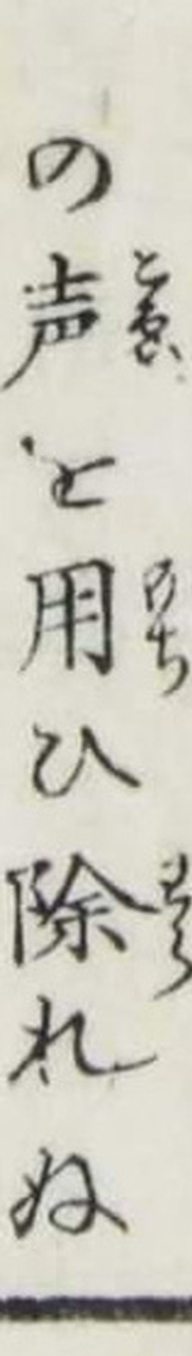の声を用ひ除れぬ
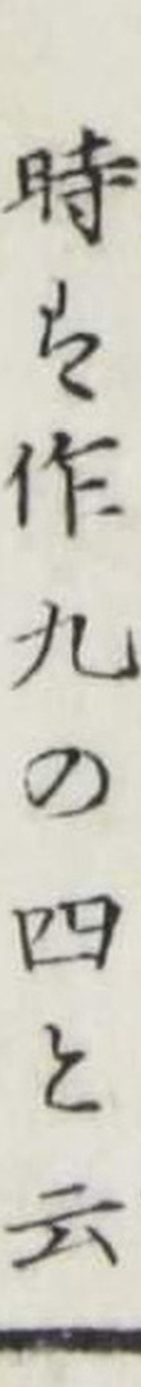時は作九の四と云
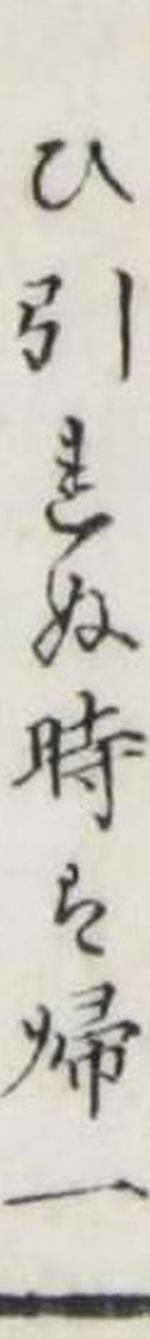ひ引れぬ時は帰一
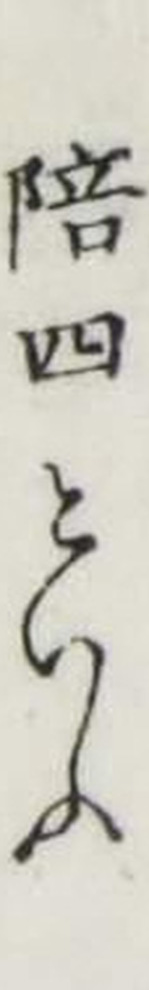陪四といふ
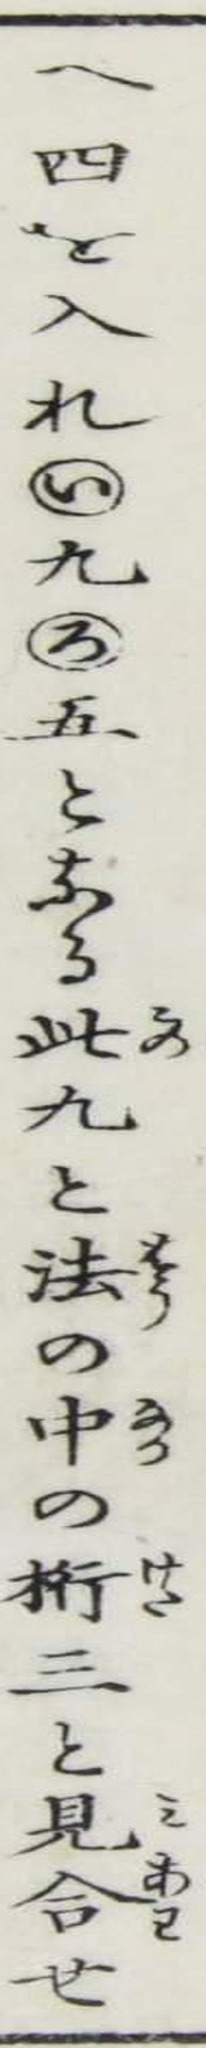へ四を入れ㋑九㋺五となる此九と法の中の桁三と見合せ
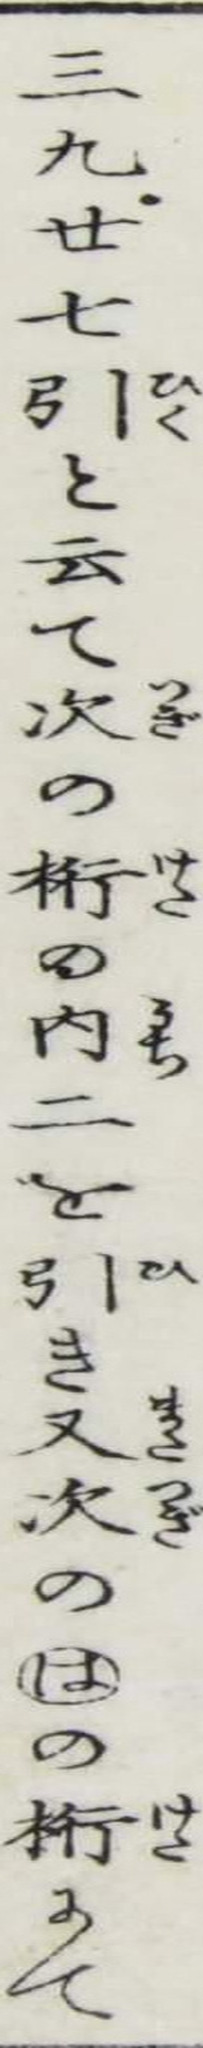三九．廿七引と云て次の桁の内二を引き又次の㋩の桁にて
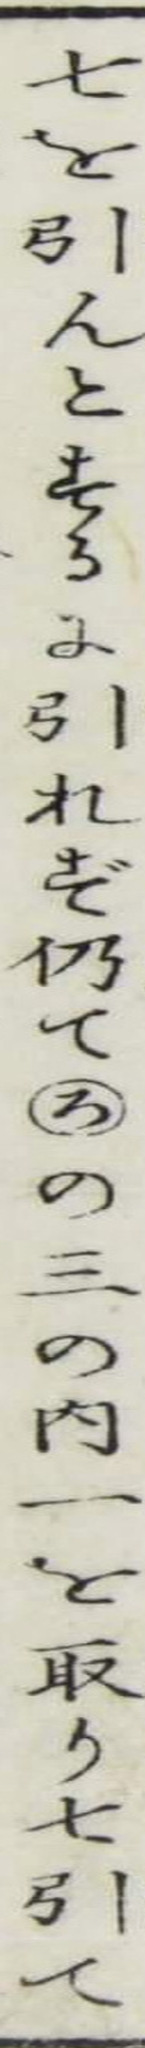七を引んとするに引れず仍て㋺の三の内一を取り七引て
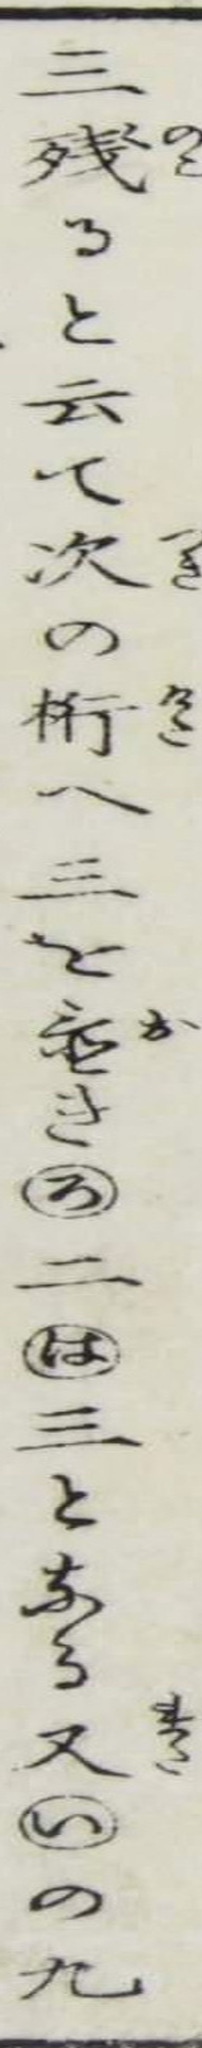三残ると云て次の桁へ三を置き㋺二㋩三となる又㋑の九
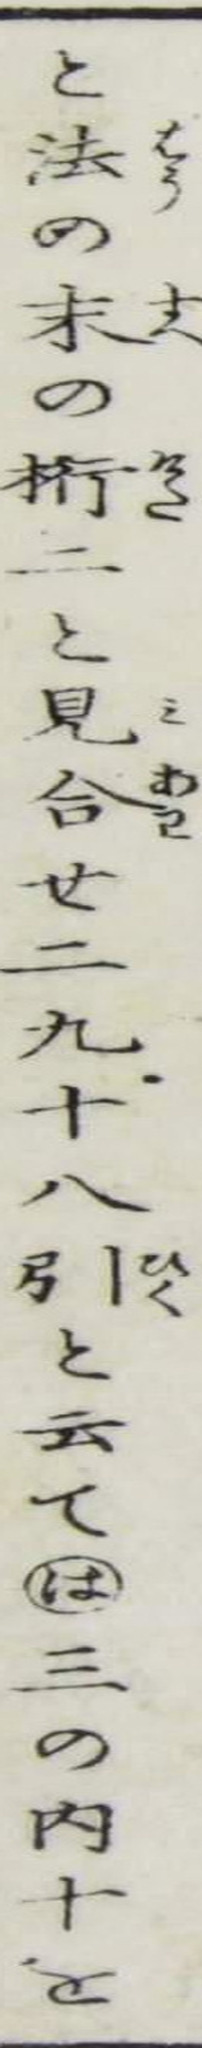と法の末の桁二と見合せ二九．十八引と云て㋩三の内十を
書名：明治小學塵劫記 卷1
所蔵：東京学芸大学教育コンテンツアーカイブ
